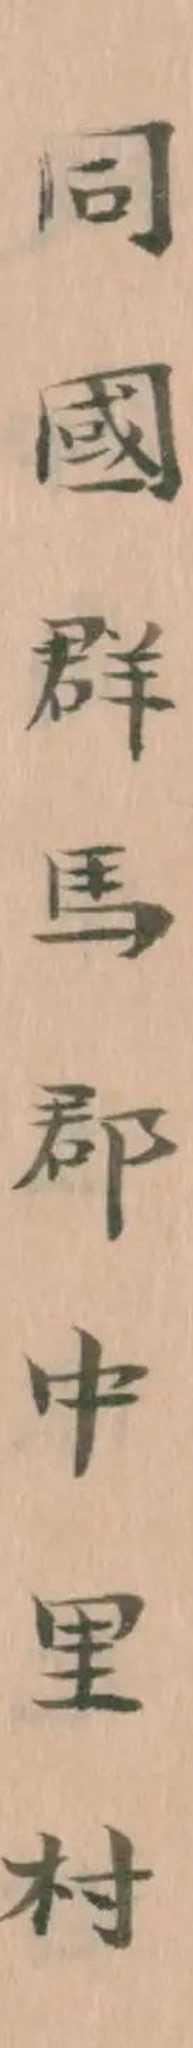同国群馬郡中里村
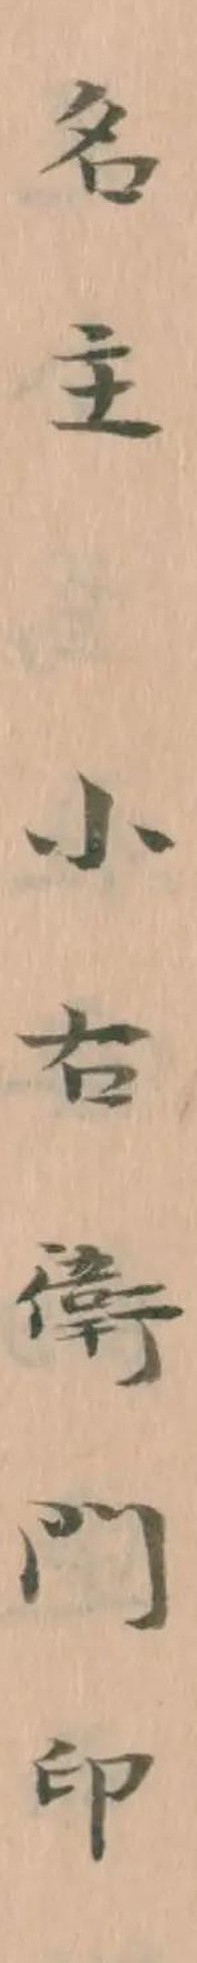名主小右衛門印
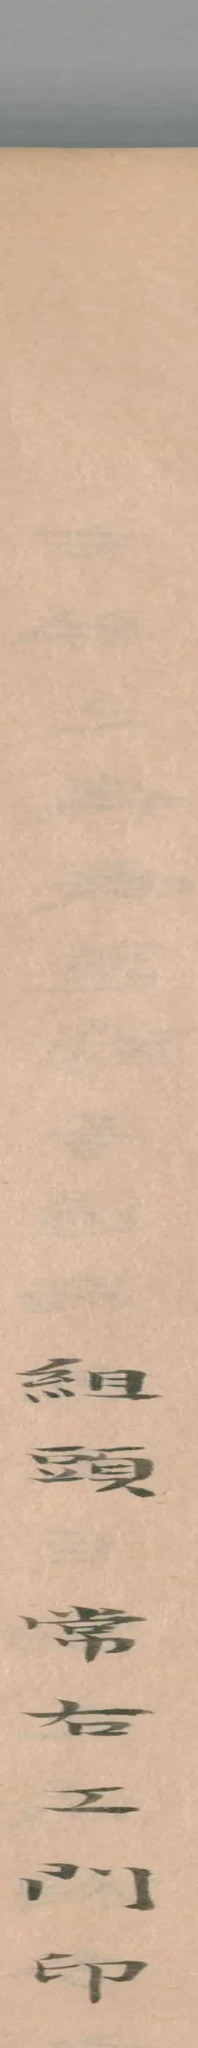組頭常右衛門印
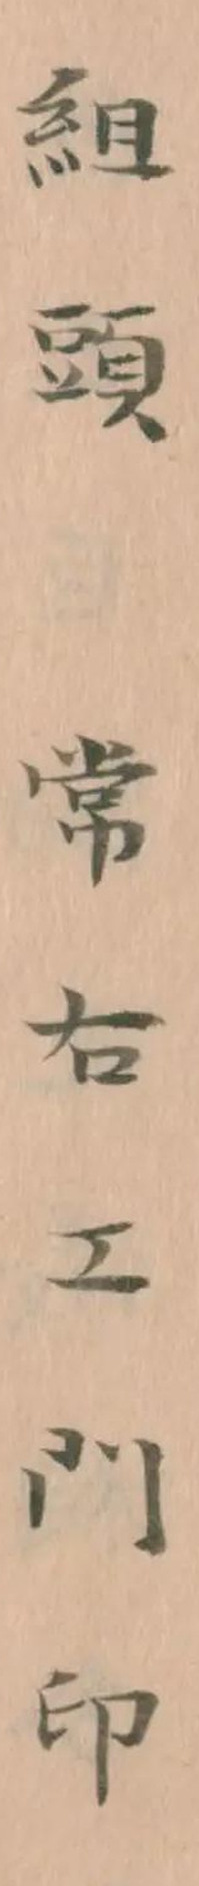組頭常右衛門印
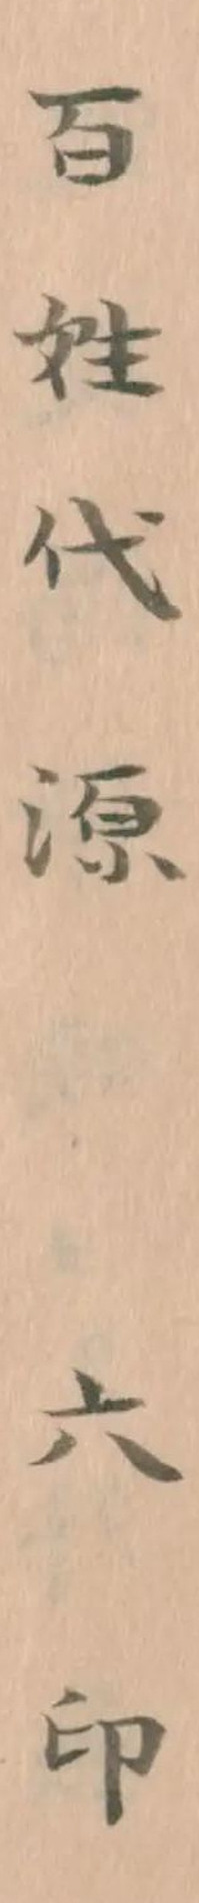百姓代源六印
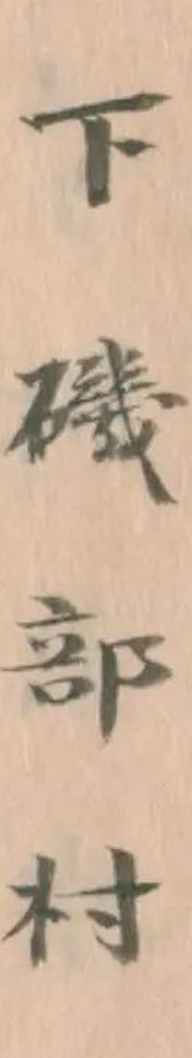下磯部村
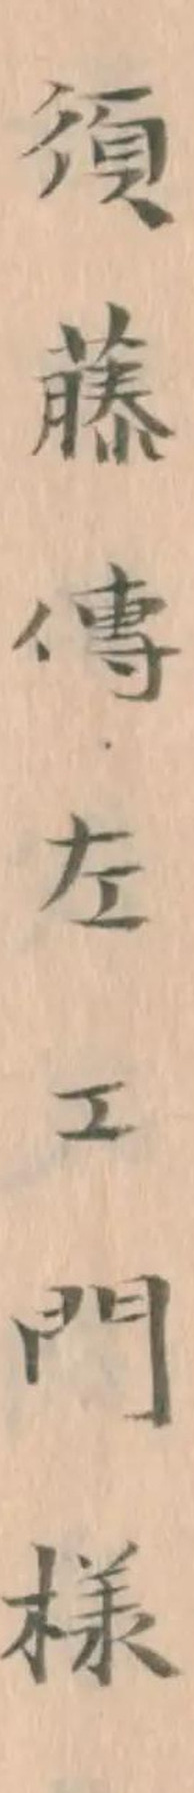須藤伝左衛門様
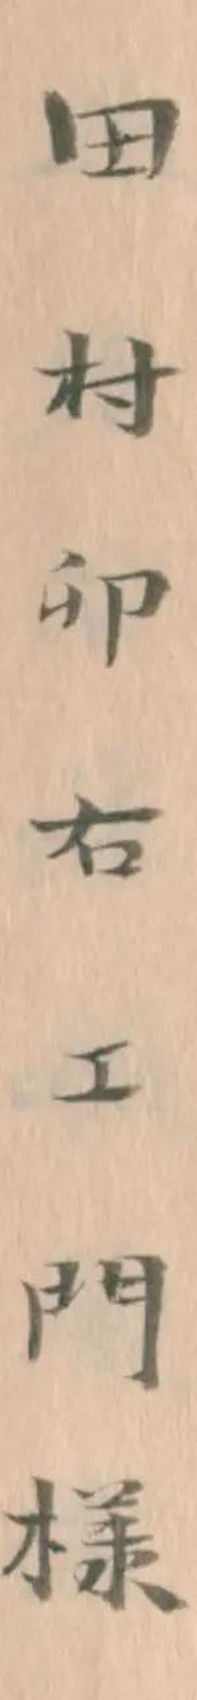田村卯右衛門様
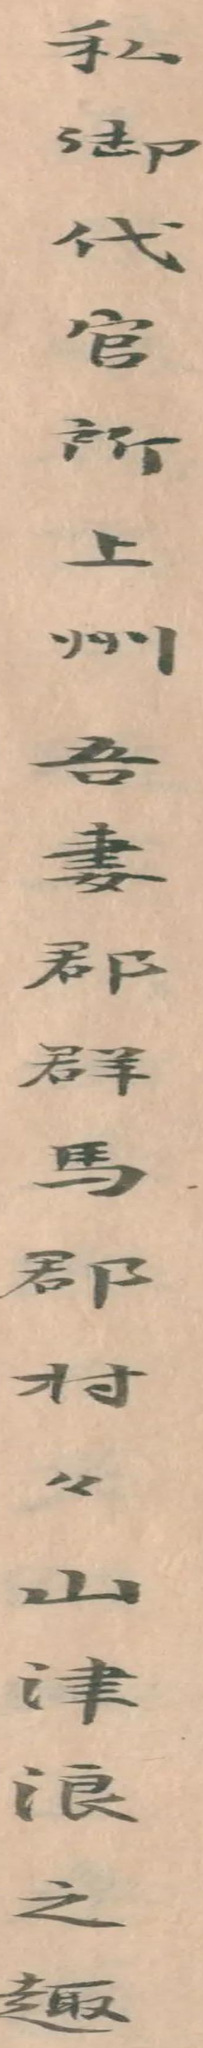私御代官所上州吾妻郡群馬郡村々山津波之趣
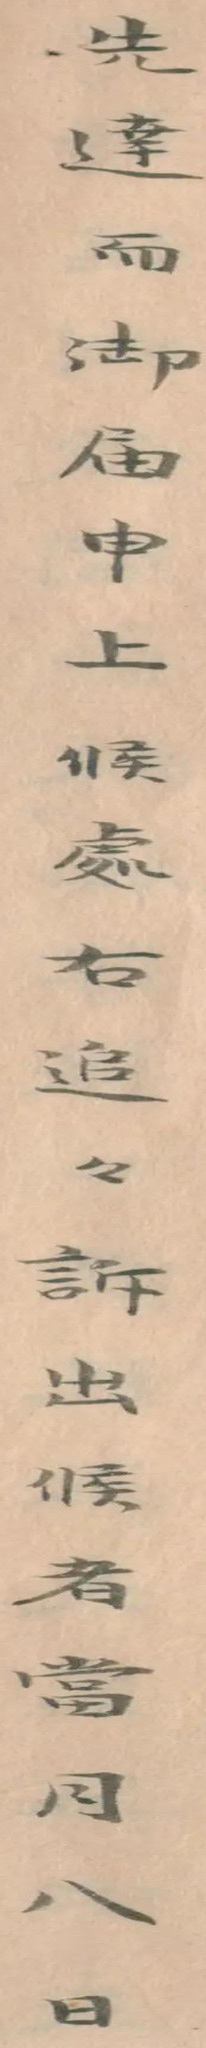先達而御届申上候処右追々訴出候者当月八日

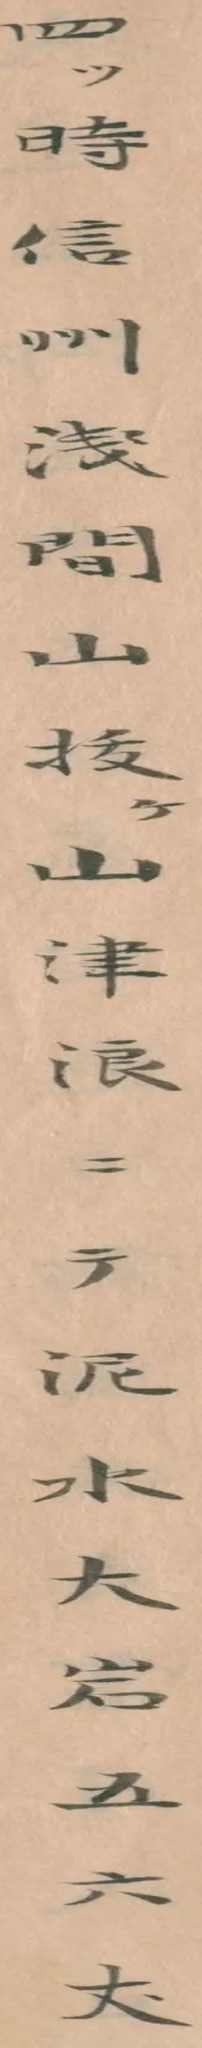四ッ時信州浅間山抜ヶ山津浪ニテ泥水大岩五六丈
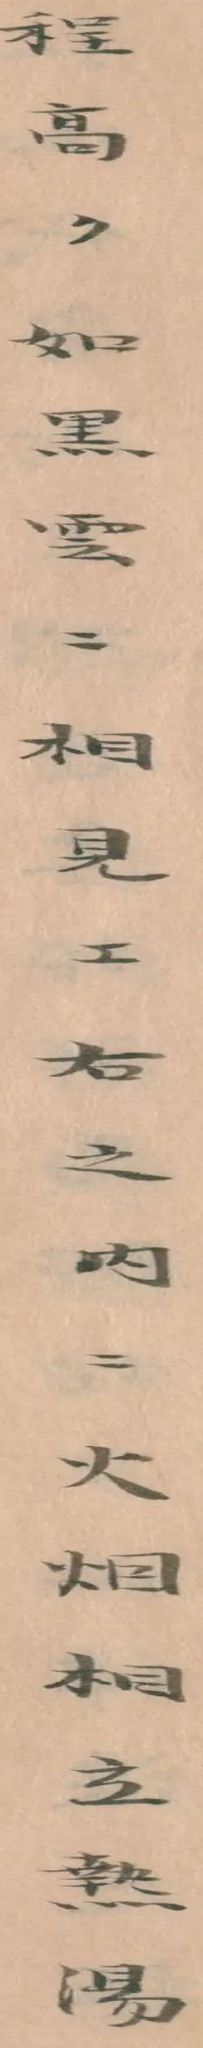程高ク如黒雲二相見エ右之内二大烟相立熱湯
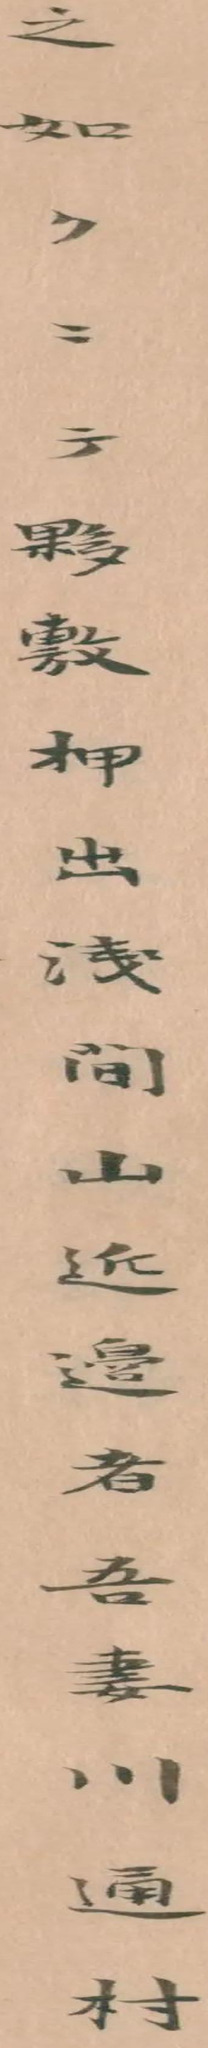之如クニテ夥敷押出浅間山近辺者吾妻川通村
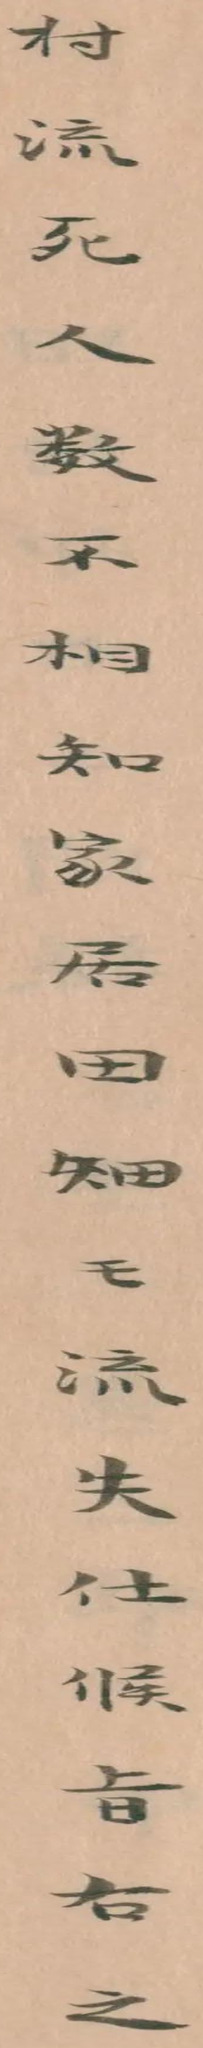村流死人数不相知家居田畑モ流失仕候旨右之
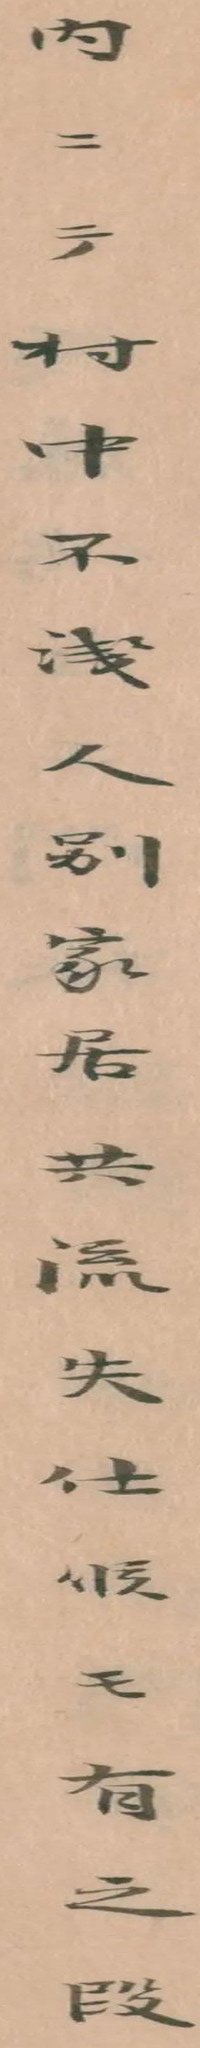内ニテ村中不浅人別家居共流失仕候モ有之段
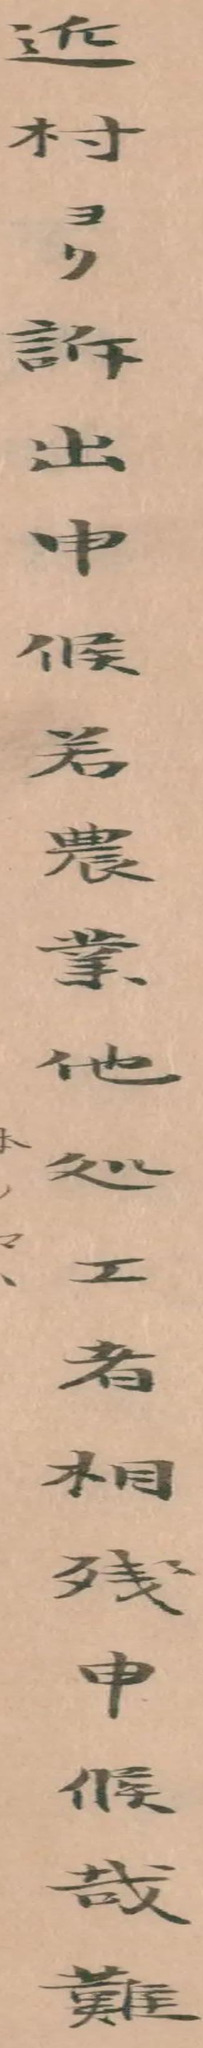近村ヨリ訴出申候若農業他処エ者相残申候哉難
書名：地災撮要. 巻1(噴火山・地震ノ部)
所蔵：国立国会図書館 National Diet Library, JAPAN
